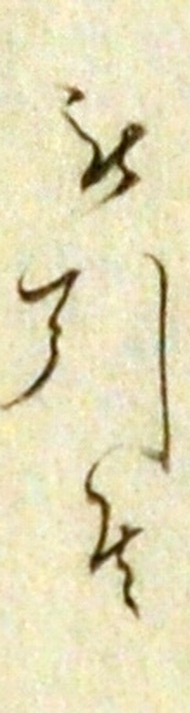被引候
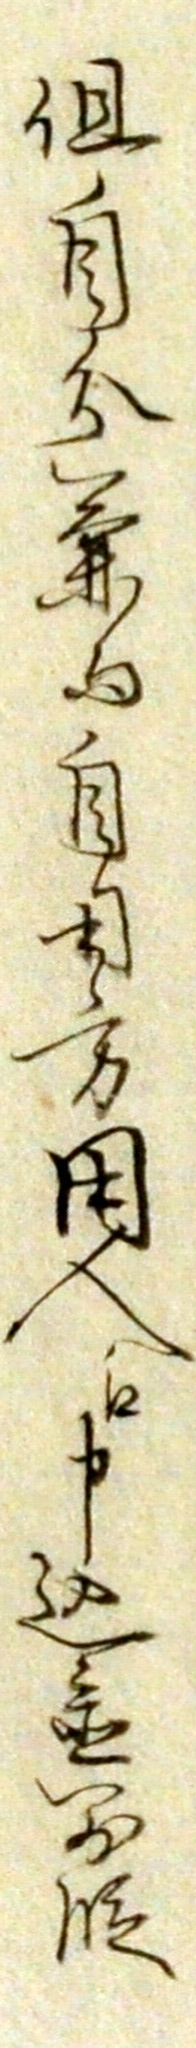但自分兼而自用方用人え申込置別段
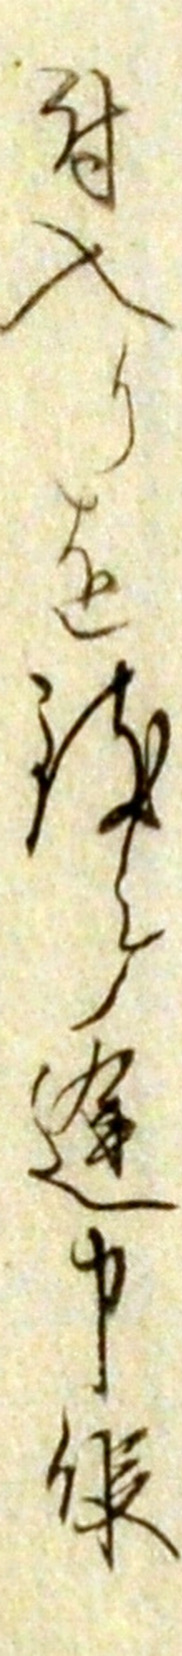付入りを致し逢申候
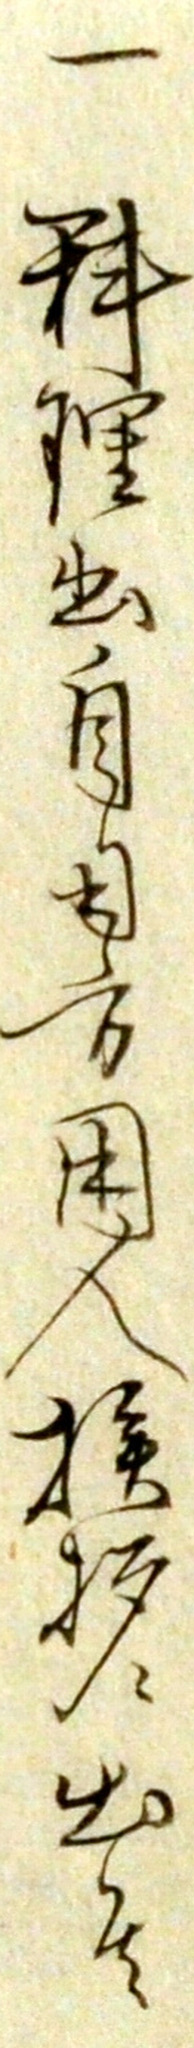一料理出自用方用人挨拶ニ出候
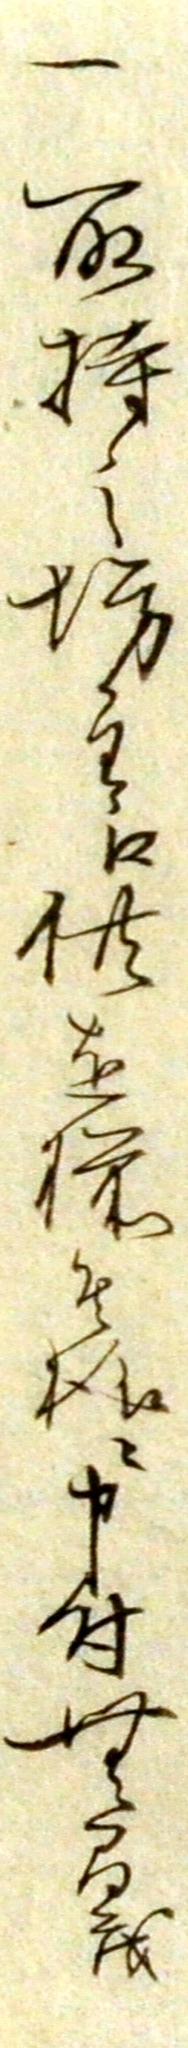一取持之坊主え供を揃候様ニ申付無間も
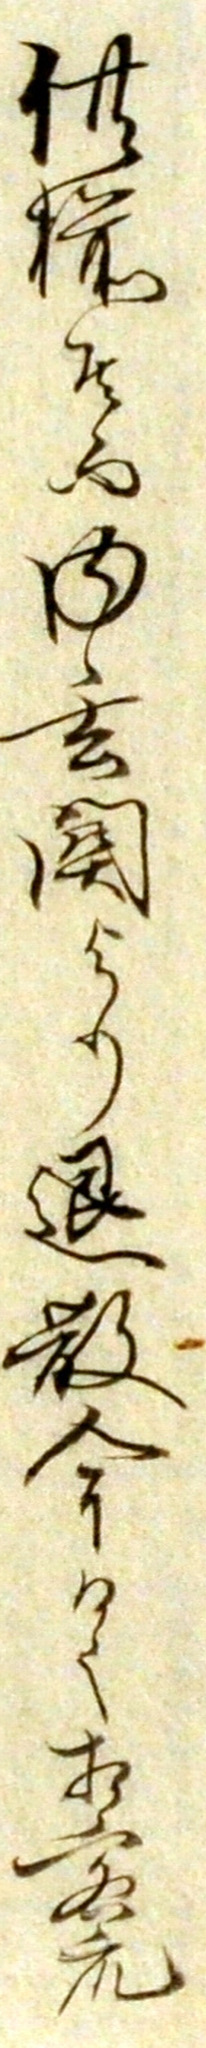供揃候而内玄関より退散今日之相客衆
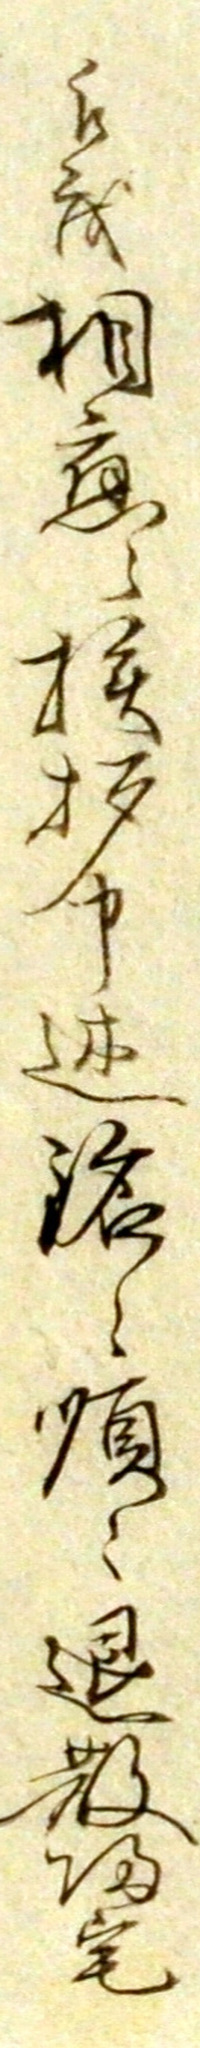えも相応ニ挨拶申述銘々順々退散帰宅
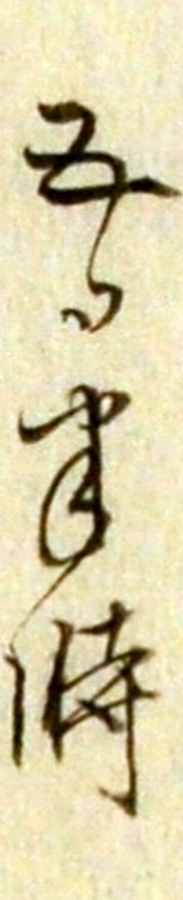五ツ半時

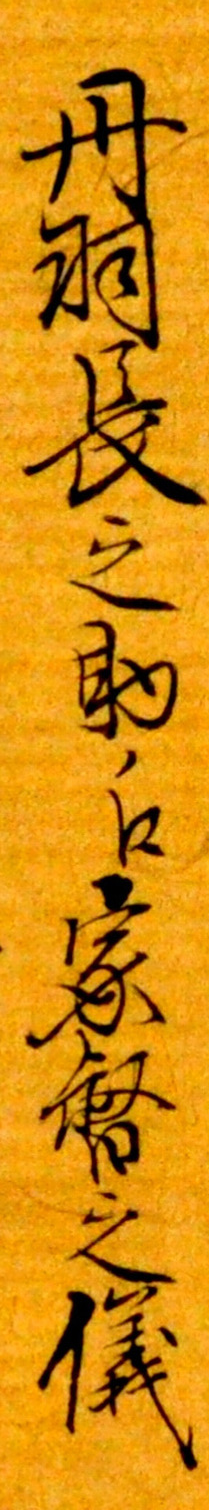丹羽長之助え家督之儀
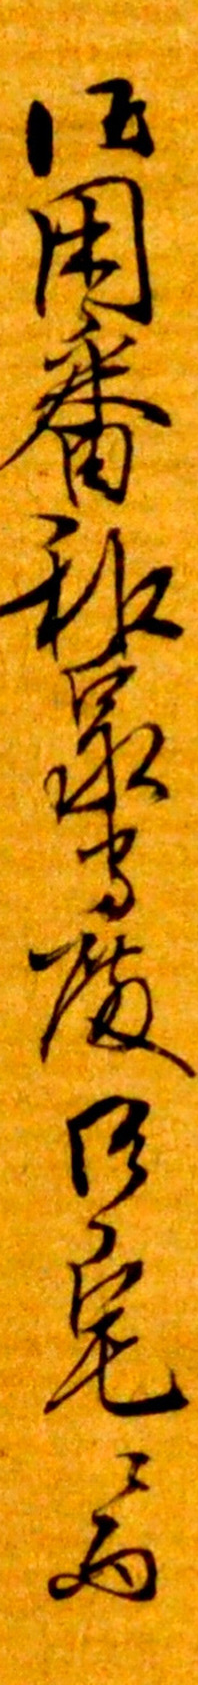御用番和泉守殿御宅ニ而
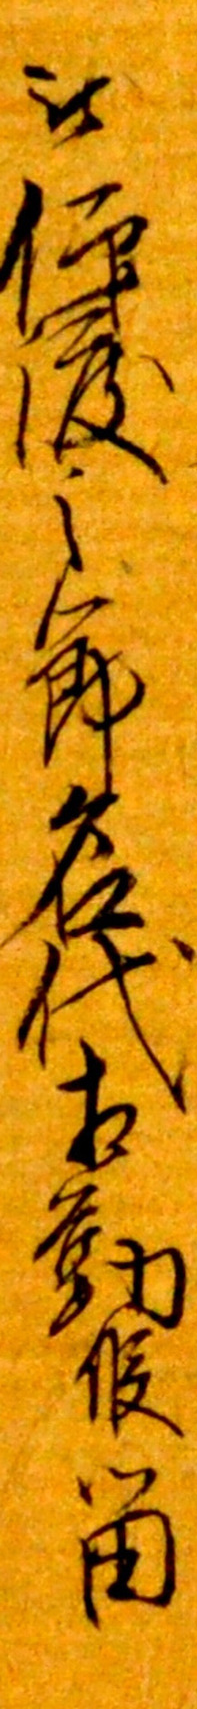被仰渡之節名代相勤候留

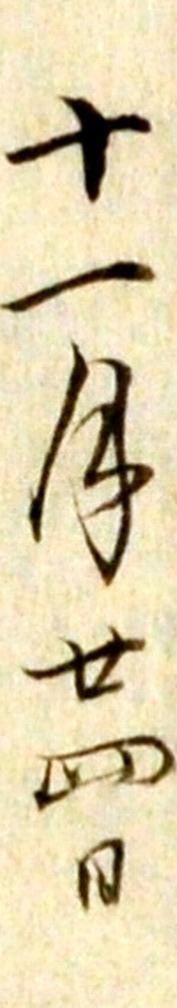十一月廿四日
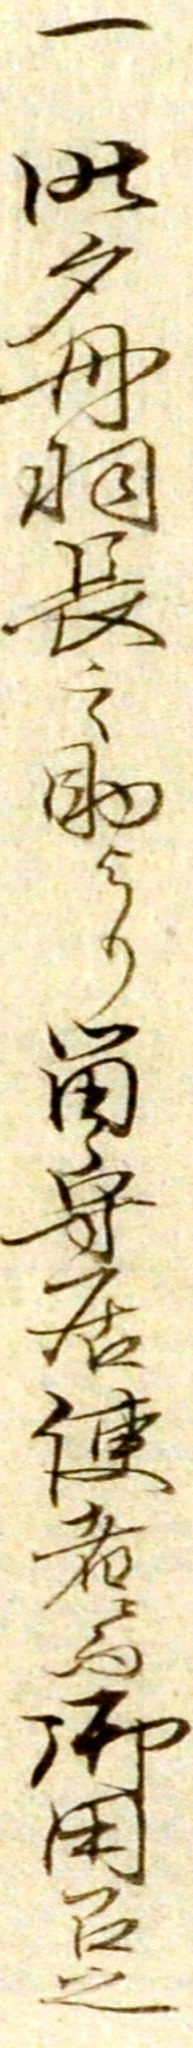一昨夕丹羽長之助より留守居使者ニ而御用召之
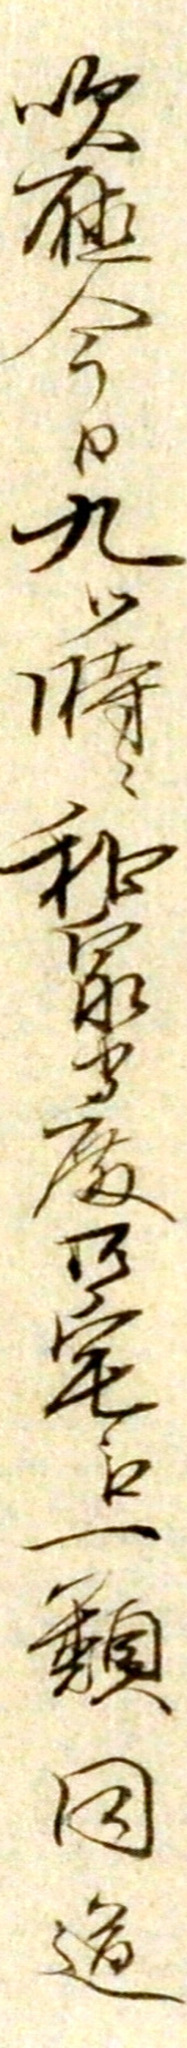吹聴今日九ツ時ニ和泉守殿御宅え一類同道
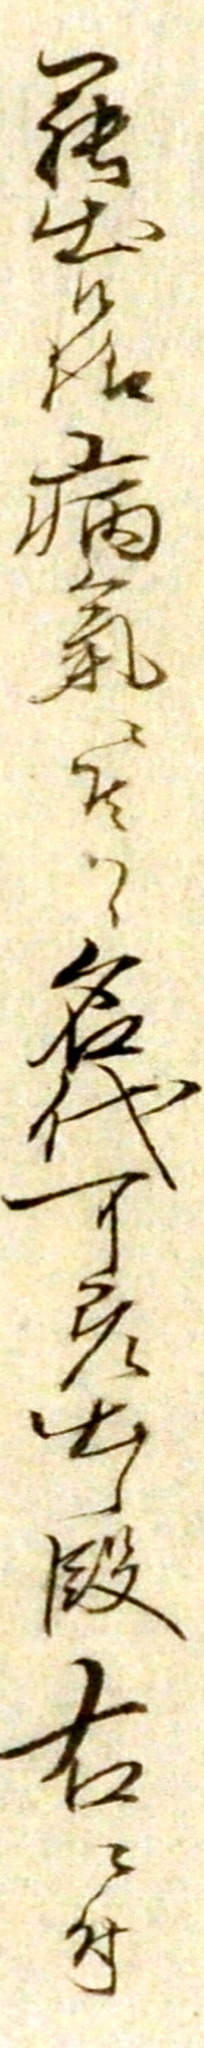罷出候様病気ニ候ハヽ名代可差出候段右ニ付
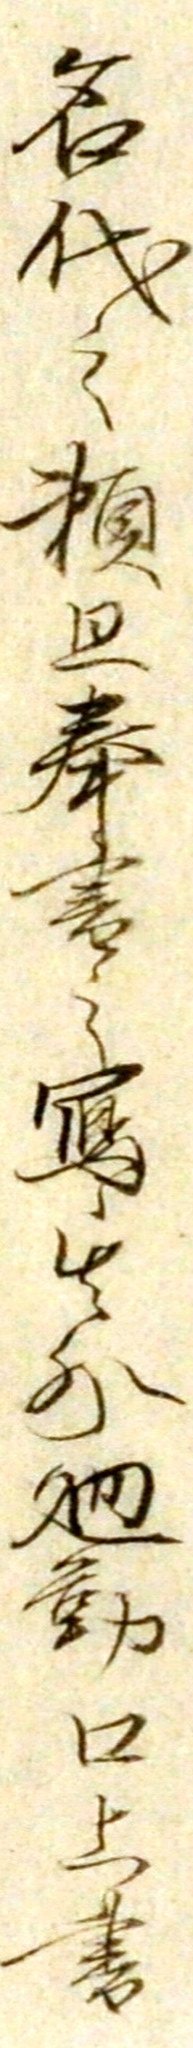名代之頼且奉書之写其外廻勤口上書
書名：諸名代相勤候節ノ留書外
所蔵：伊那市立高遠町図書館・合同会社AMANE
